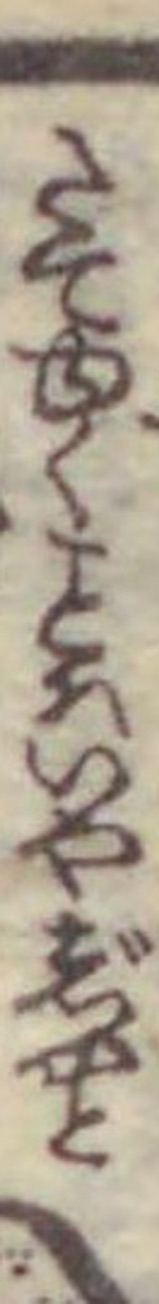たてゆくことはいやじやと
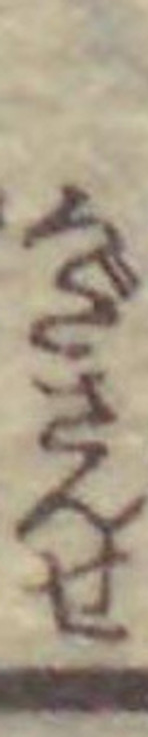くださんせ
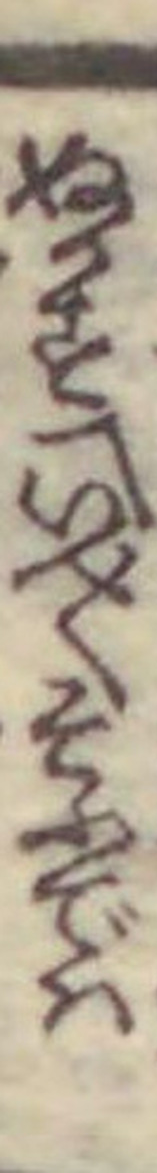ぬかす〽いへ〳〵そふでは
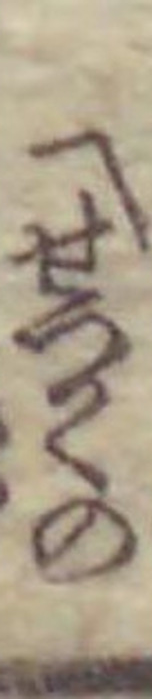〽せつかくの
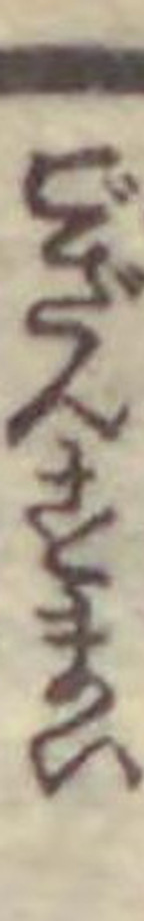ござんすまい
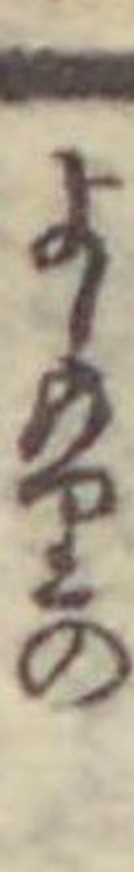よしもりの
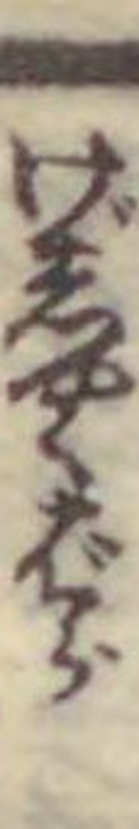げしやくばら
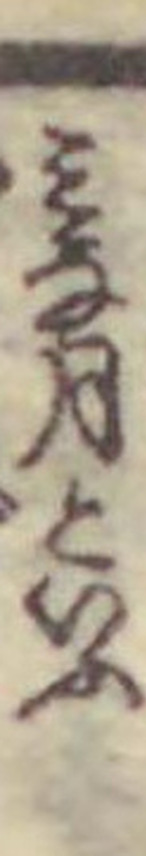みな月といふ
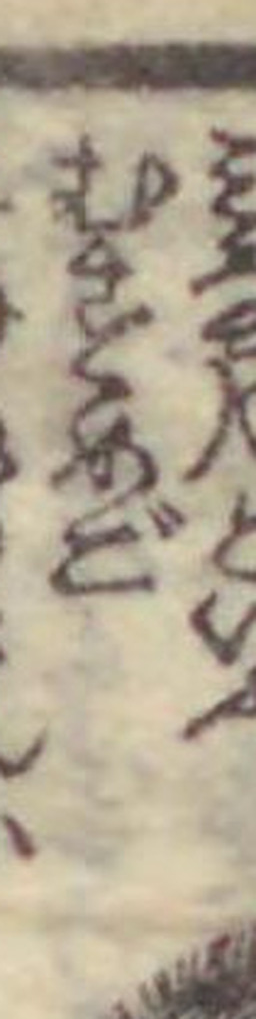むすめご
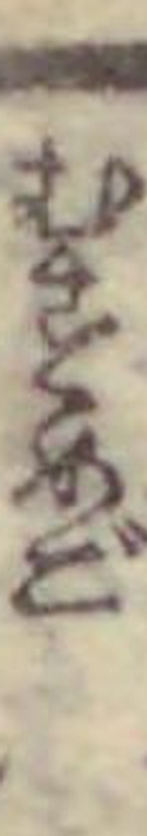むすめご
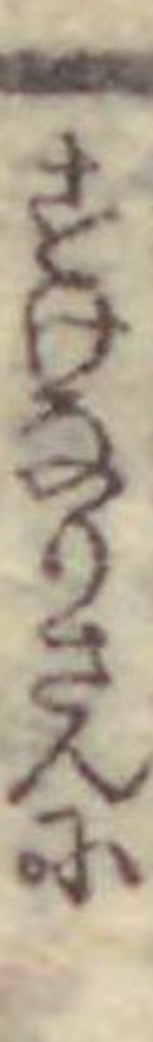すけなりさんに
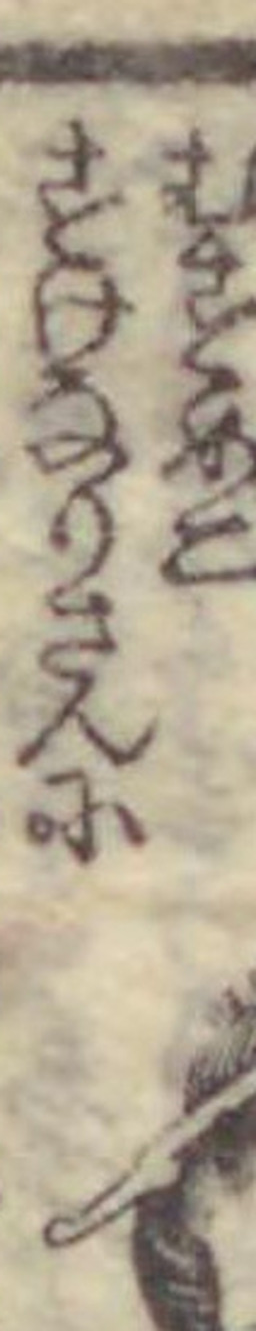すけなりさんに
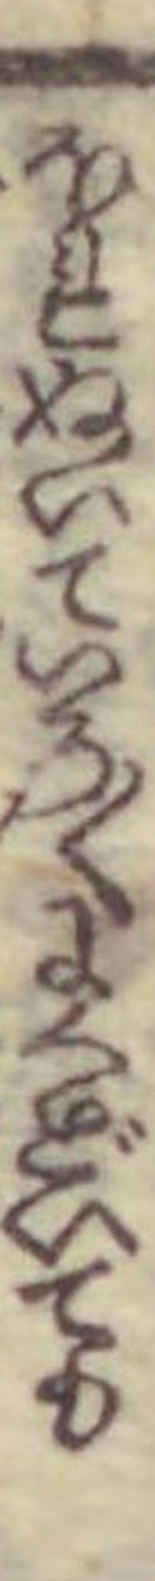ほれぬいていろ〳〵にくどいても
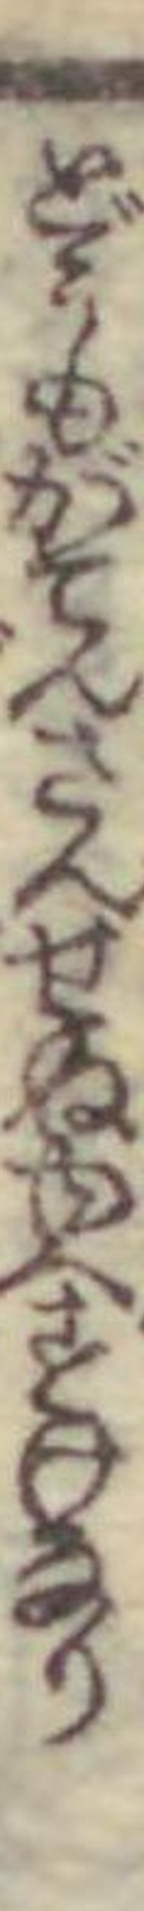どうもがてんさんせぬゆへすけなり
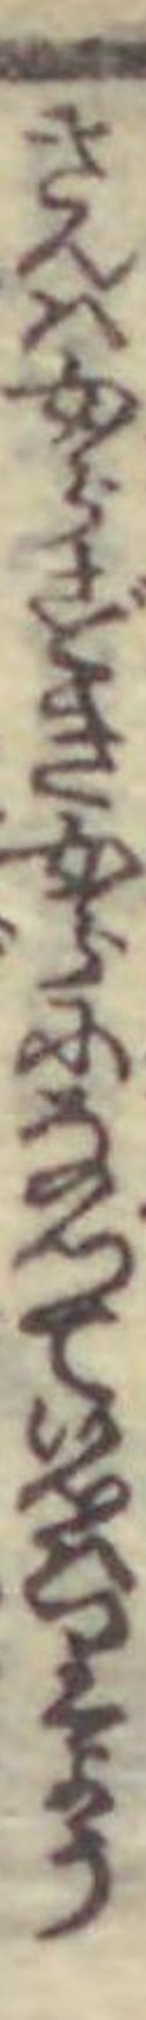さんは女郎ずき女郎になつて思はりよう
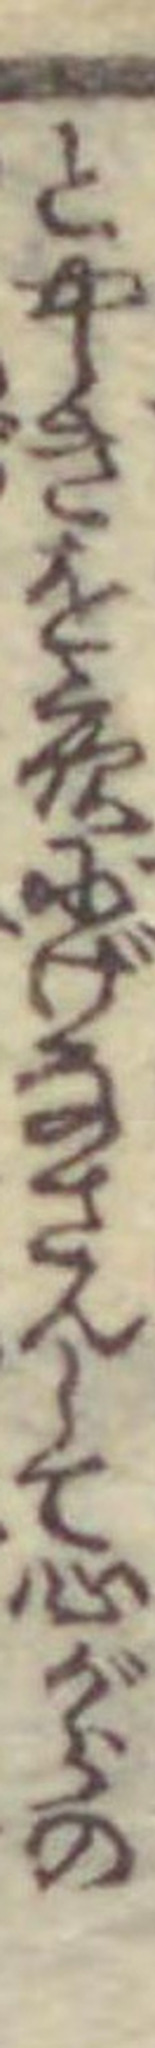とやしきを夜にげなさんして心がらの
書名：大時代唐土化物 3巻. 曽我太夫染
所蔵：国立国会図書館 National Diet Library, JAPAN
